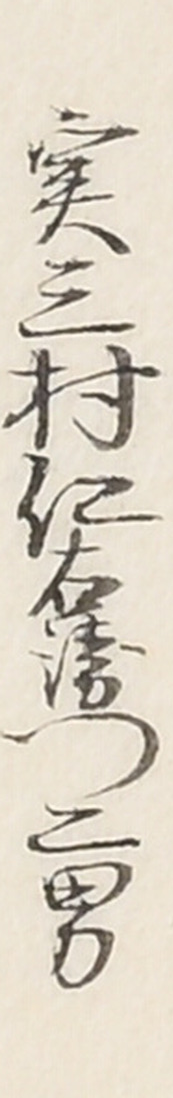実三村仁右衛門二男
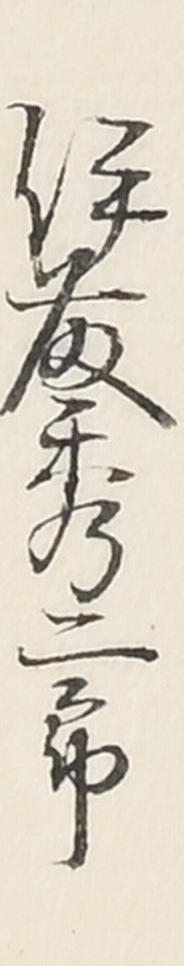伊藤秀二郎
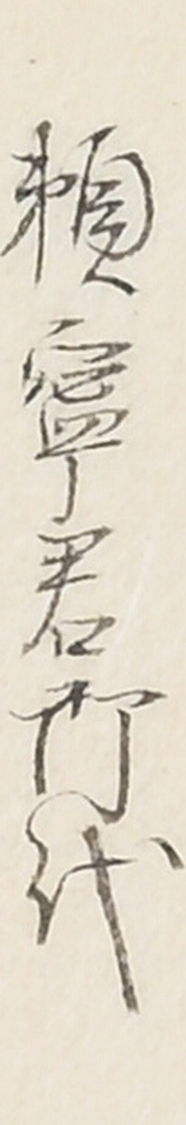頼寧君御代
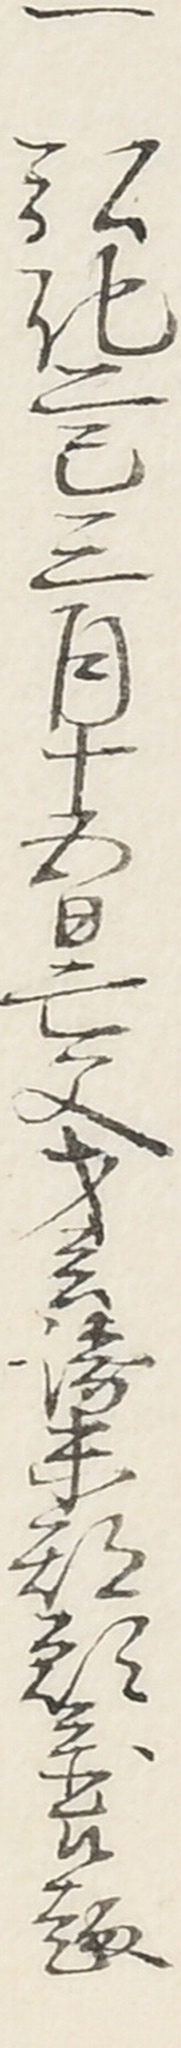一弘化二巳三月十五日亡父才兵衛末期願置候趣
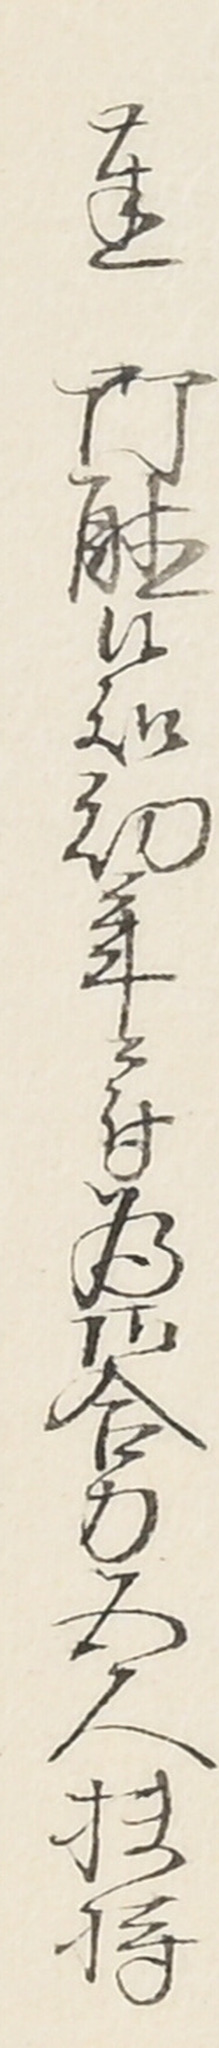達御聴候処幼年ニ付為御合力五人扶持
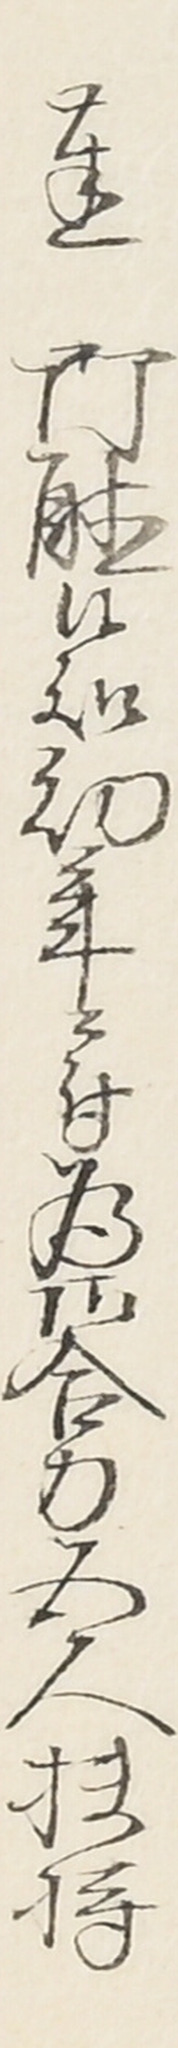達御聴候処幼年ニ付為御合力五人扶持
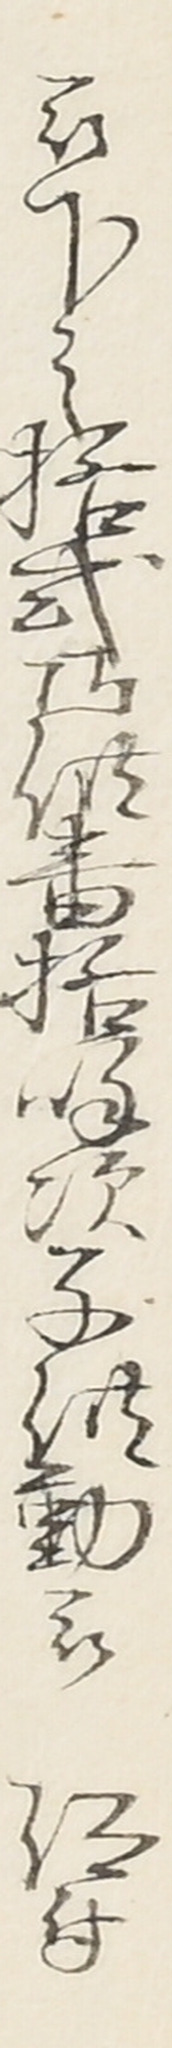被下之格式御供番格呼次子供勤被仰付
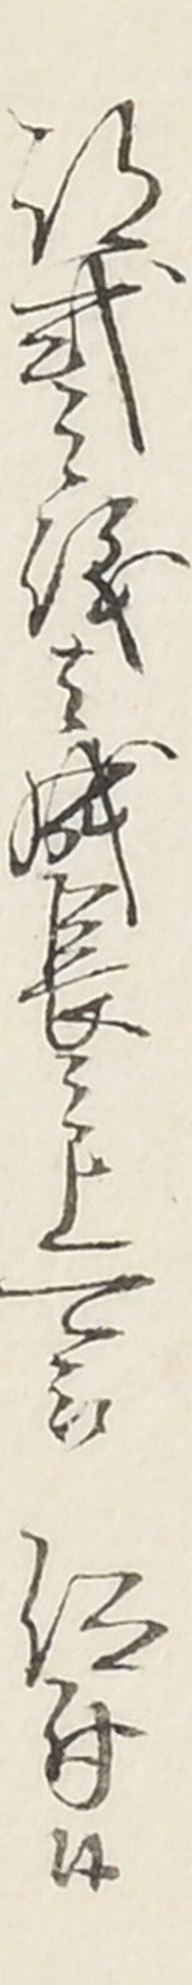跡式之儀者成長之上可被仰付候
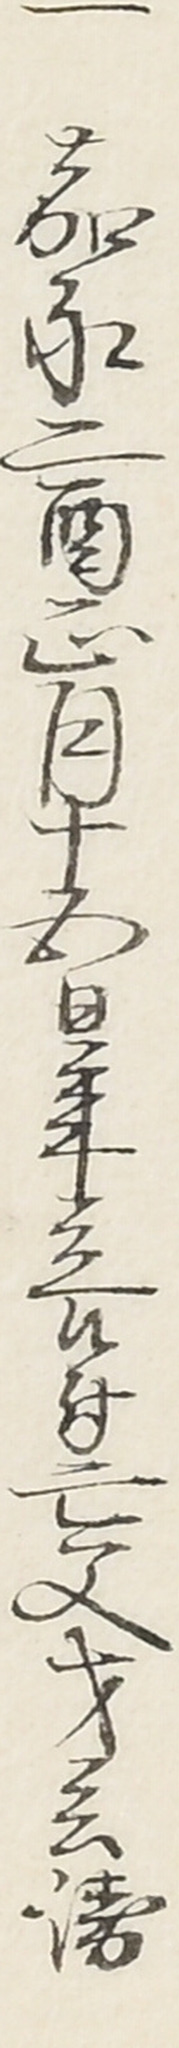一嘉永二酉正月十五日年立候付亡父才兵衛
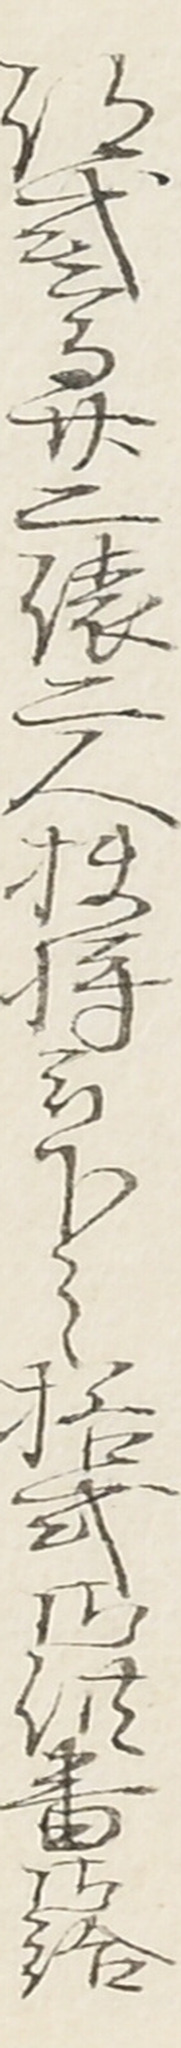跡式高廿二俵二人扶持被下之格式御供番御給
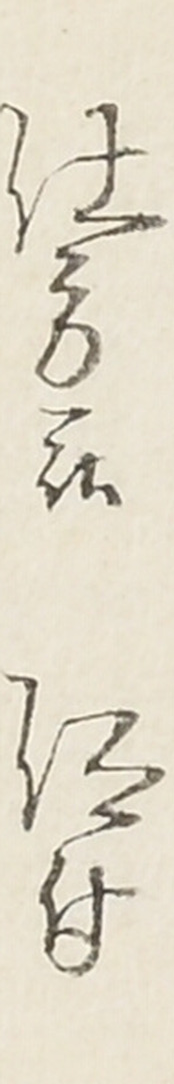仕方被仰付
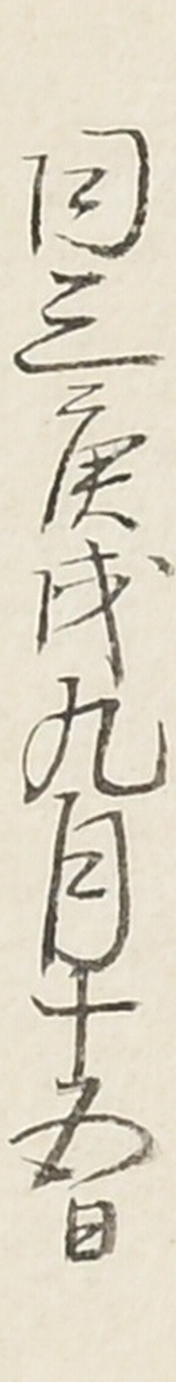一同三庚戌九月十五日
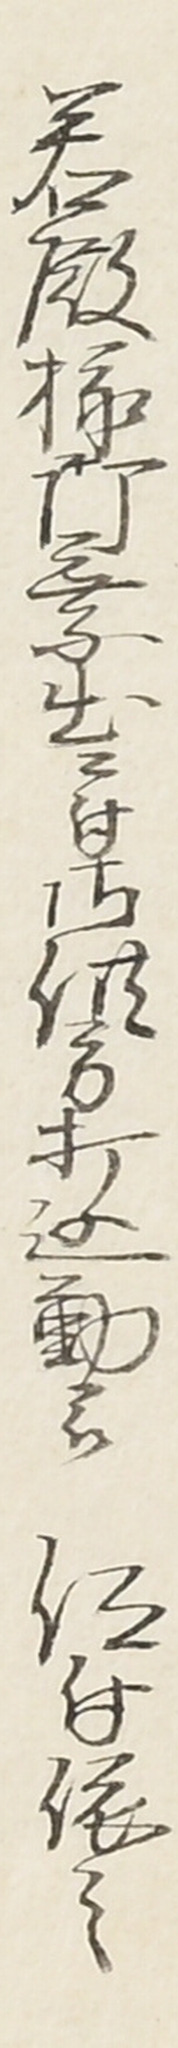若殿様御乗出ニ付御供打込勤被仰付依之
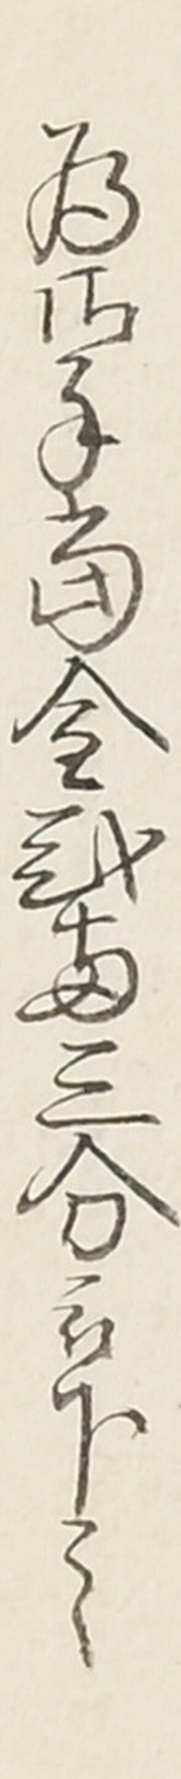為御手金弐両三分被下之

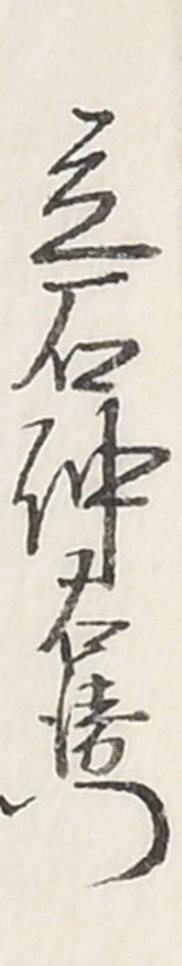立石仲右衛門
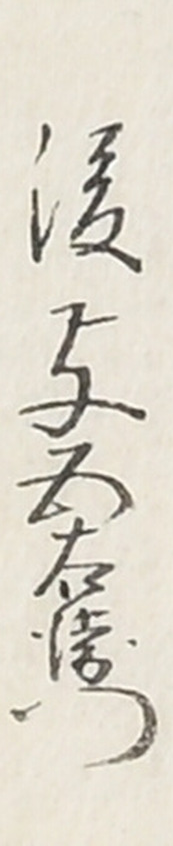後与五右衛門
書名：無足諸士勤仕録（四）
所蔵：伊那市立高遠町図書館・合同会社AMANE
